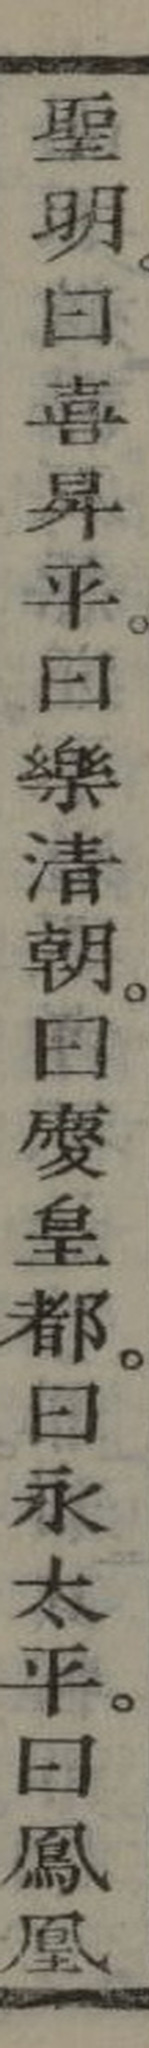聖明。曰喜昇平。曰樂清朝。曰慶皇都。曰永太平。曰鳳凰
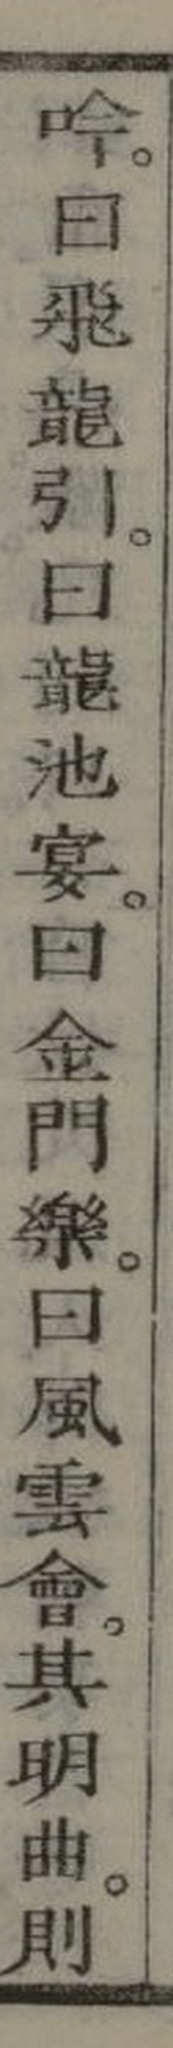吟。曰飛龍引。曰龍池宴。曰金門樂。曰風雲會。其明曲。則
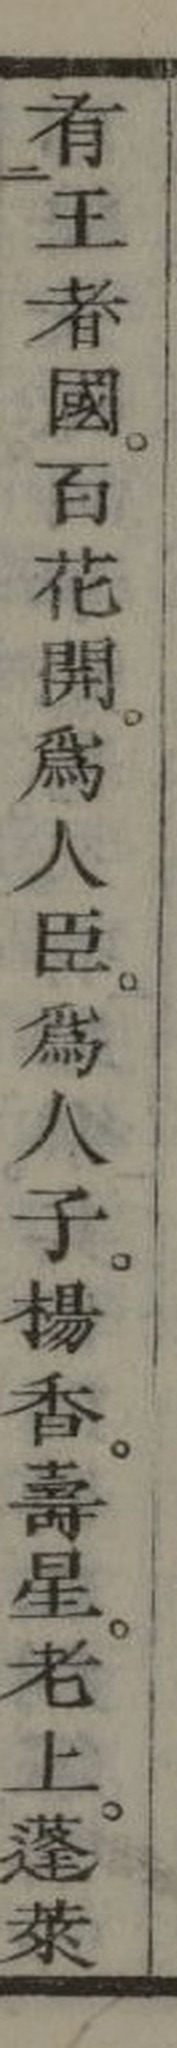有王者國。百花開。爲人臣。爲人子。楊香。壽星。老上。蓬萊
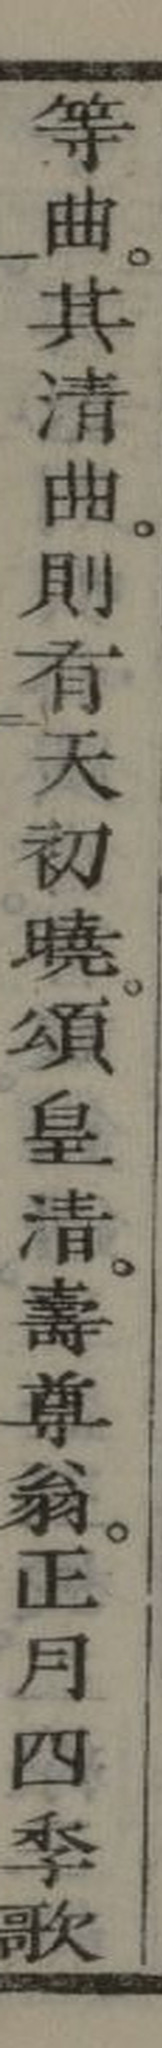等曲。其清曲。則有天初曉。頌皇清。壽尊翁。正月四季歌

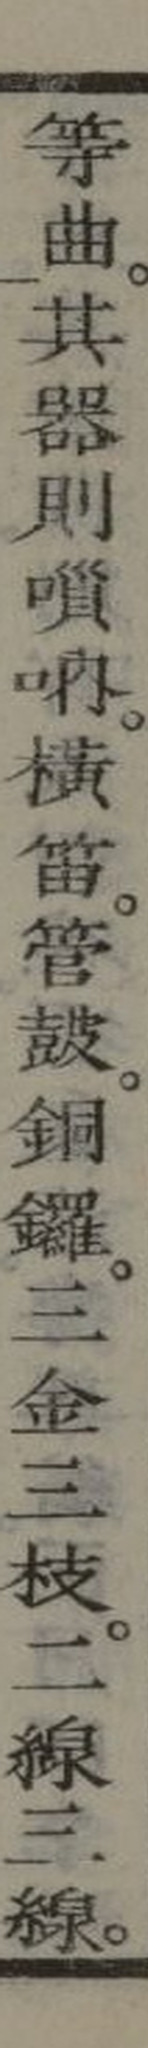等曲。其器則嗩吶。横笛。管皷。銅鑼。三金三枝。二線三線。
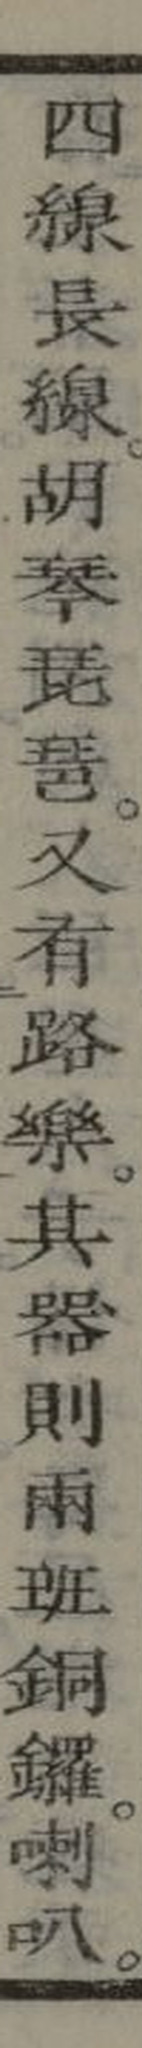四線長線。胡琴琵琶。又有路樂。其器則兩班銅鑼。喇叭。
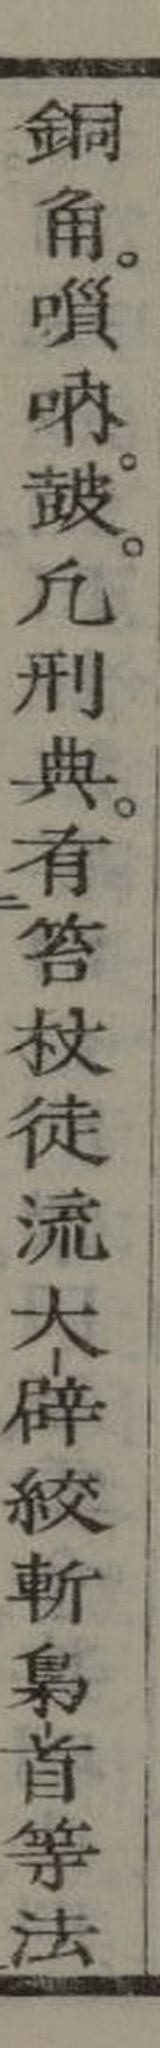銅甬。嗩吶。皷。凢刑典。有笞杖徒流大-辟絞斬梟-首等法
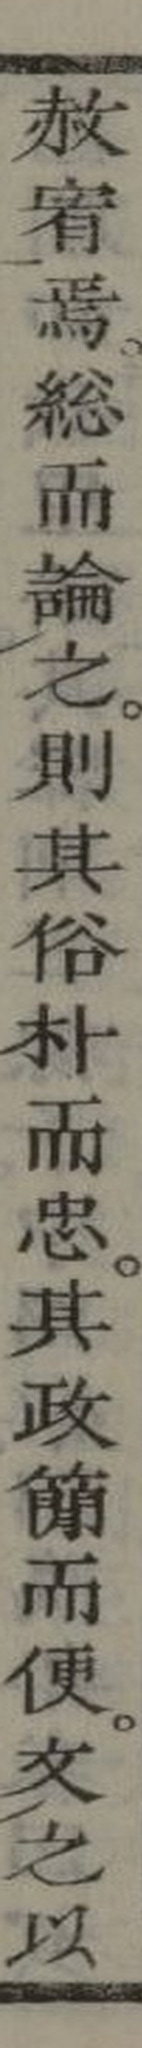赦宥焉。総而論之。則其俗朴而忠。其政簡而便。文之以
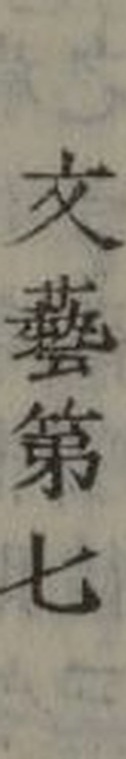文藝第七
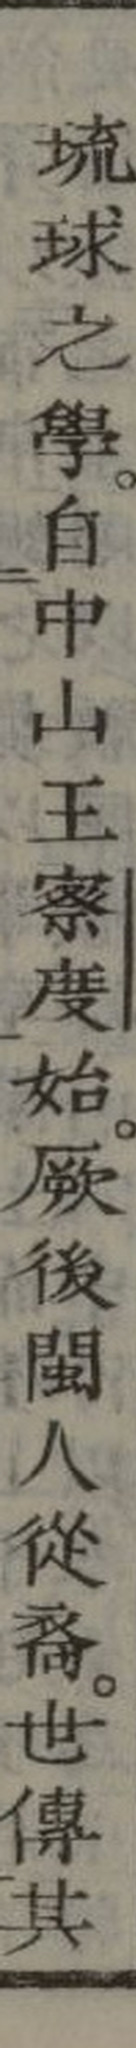琉球之學。自中山王察度始。厥後閩人從裔。世傳其
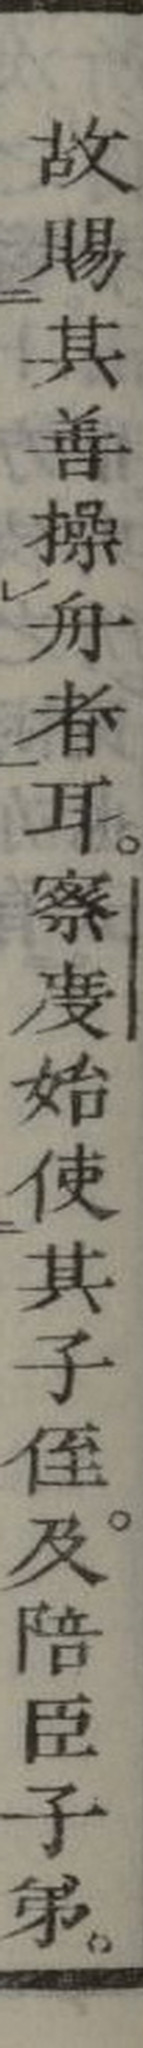故賜其善操舟者耳。察度始使其子侄。及陪臣子弟。

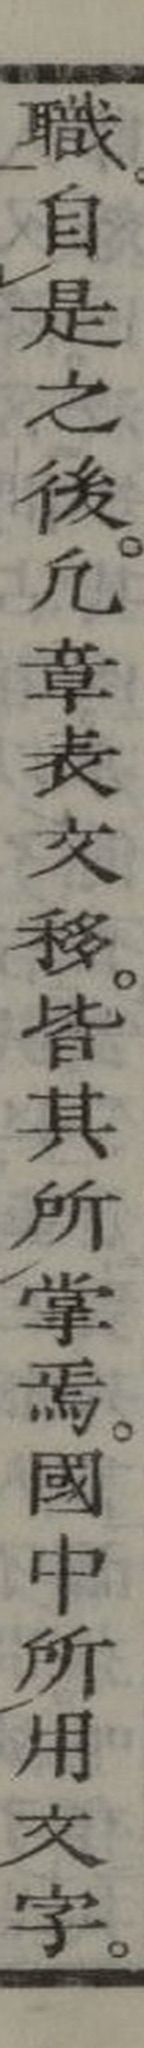職。自是之後。凢章表文移。皆其所掌焉。國中所用文字。
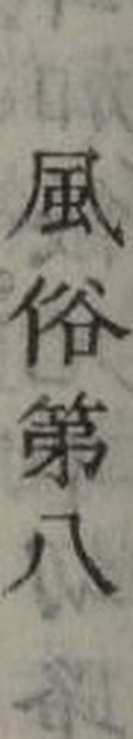風俗第八
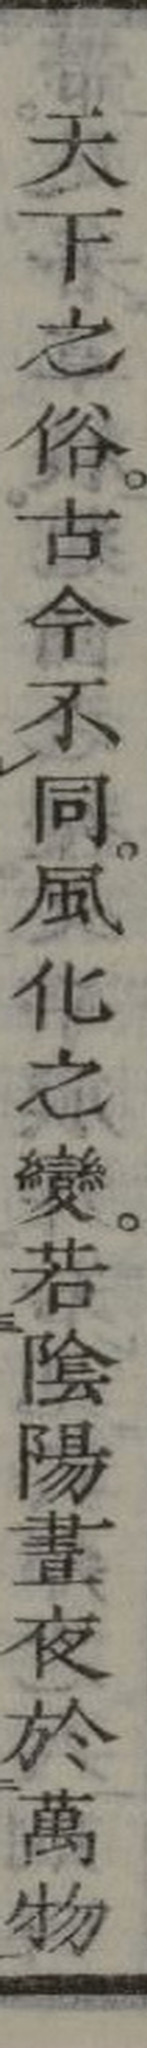天下之俗。古今不同。風化之變。若隂陽晝夜於萬物
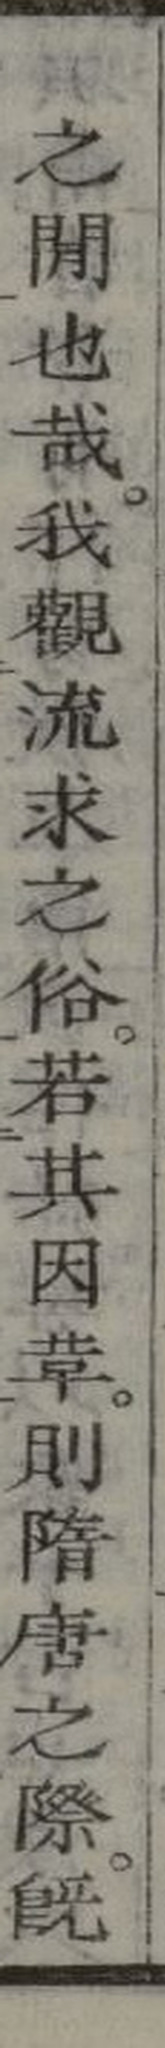之閒也哉。我觀流求之俗。若其因。則隋唐之際。既
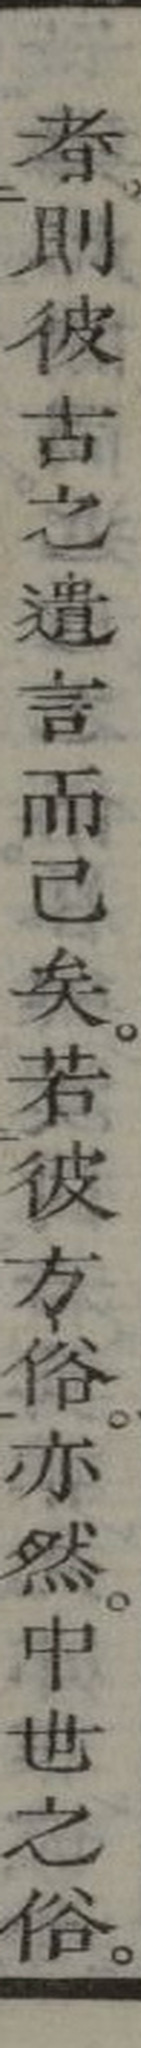者。則彼古之遺言而已矣。若彼方俗。亦然。中世之俗。
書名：南島志 呂
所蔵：University of the Ryukyus Library
